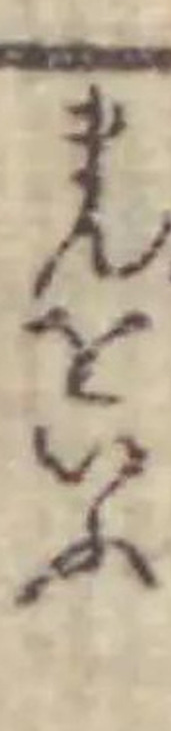まんをいふ
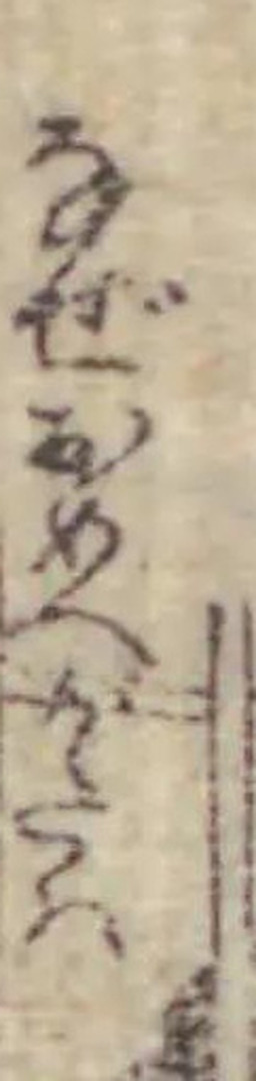なぜおめへがたは
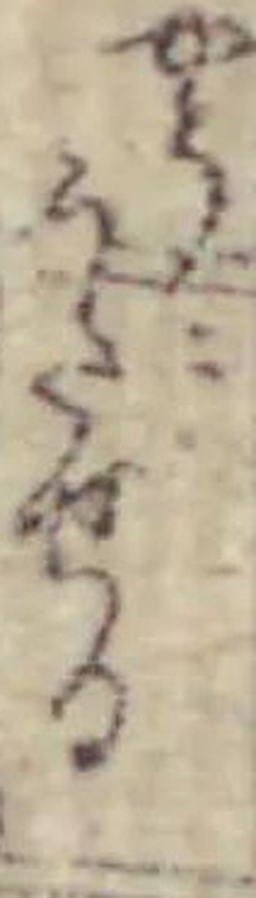かたせる
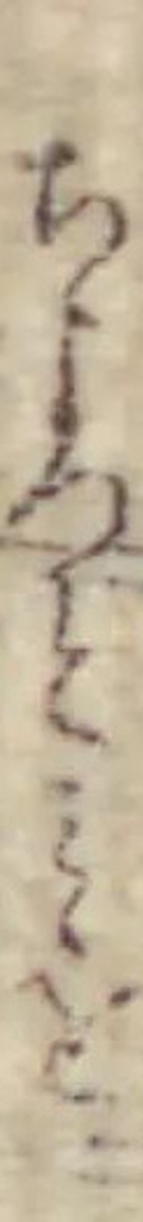ちよつとみゝを
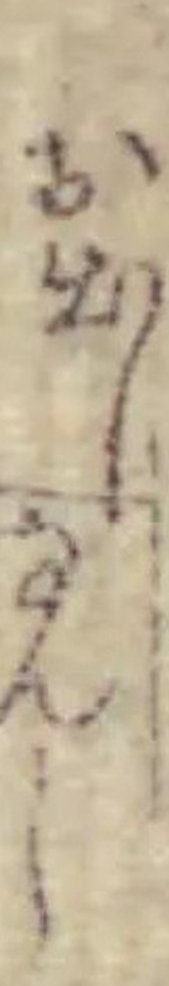お出しなんし
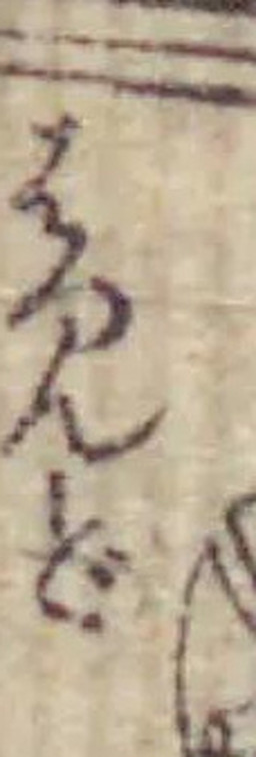はつんど
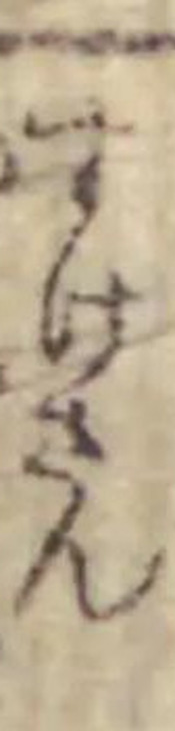すけさん
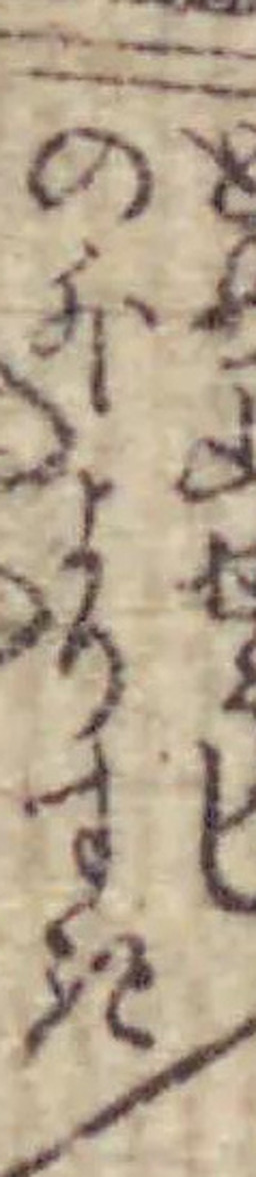の外よりすき
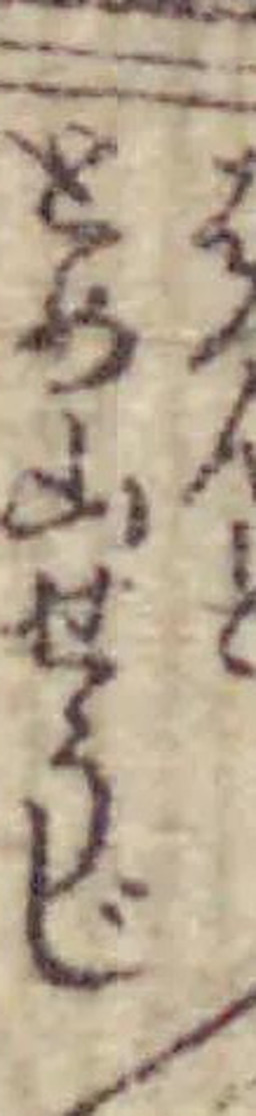とめ山せうじ
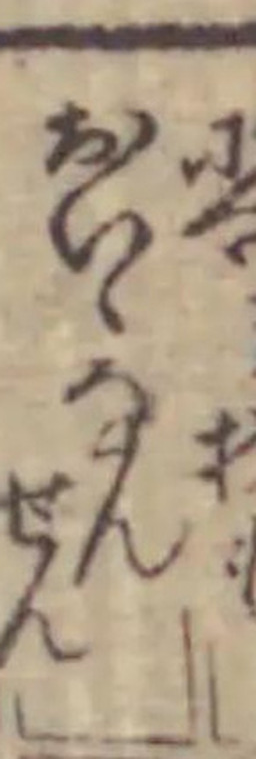おいゝなん
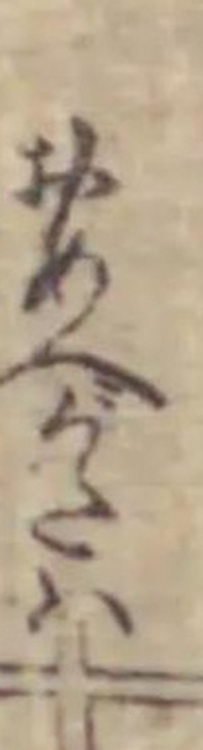おめへがたは
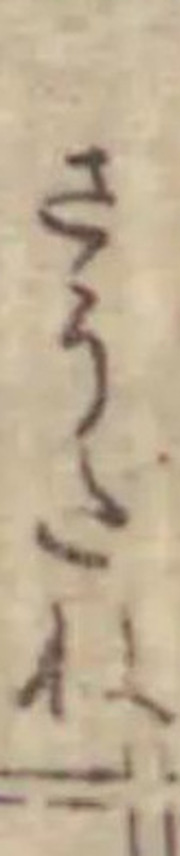さうだね
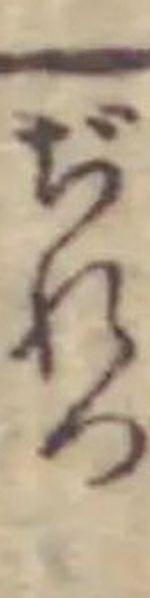ぢれつ
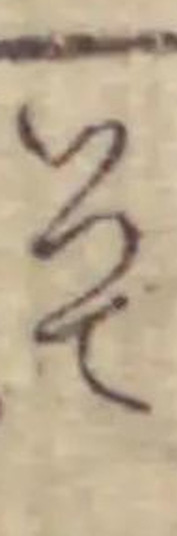いつて
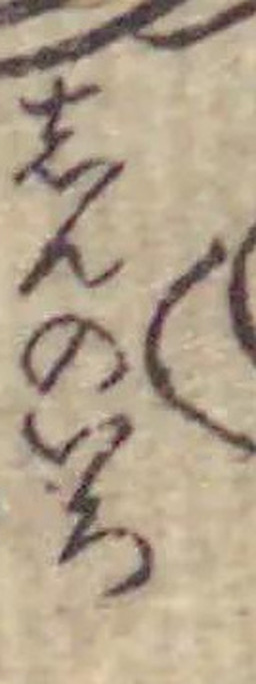しんのいろ
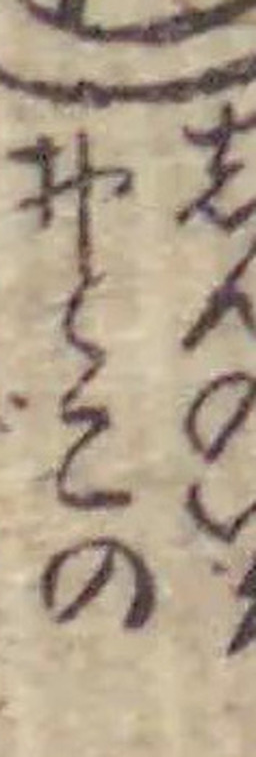おとこの
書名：亀山人家妖 3巻
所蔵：国立国会図書館 National Diet Library, JAPAN
